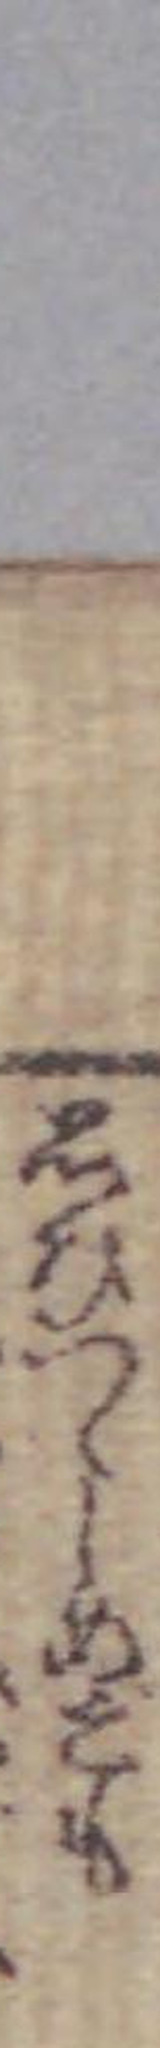思ひつゝしめども
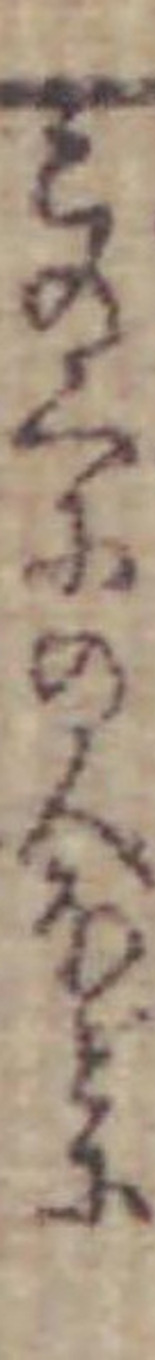このくにの人ほどに
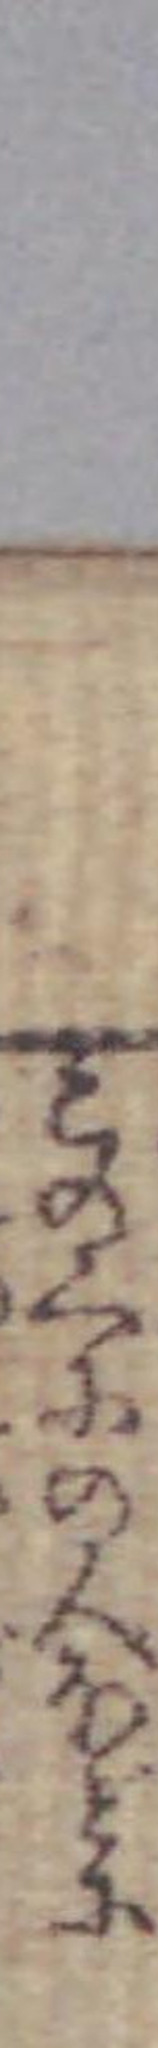このくにの人ほどに
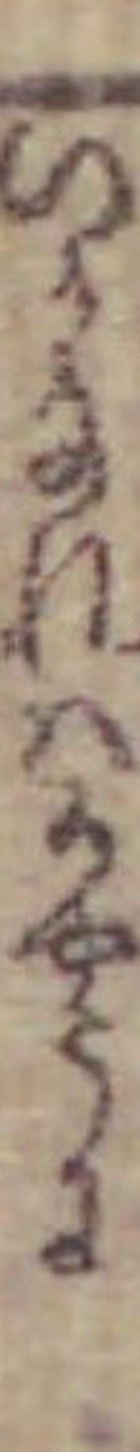いかなれはかやうに
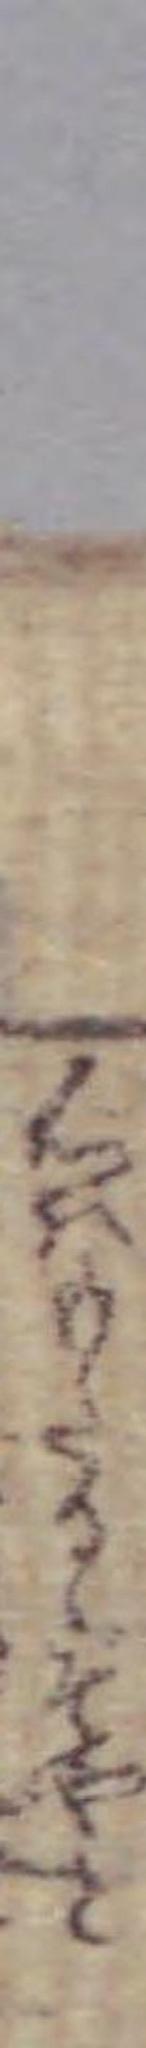心はもたるゝぞやと
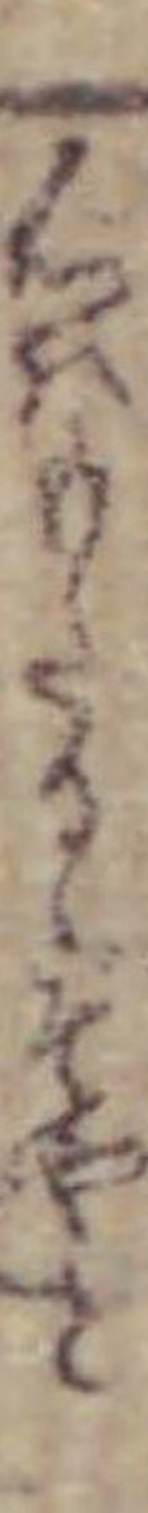心はもたるゝぞやと
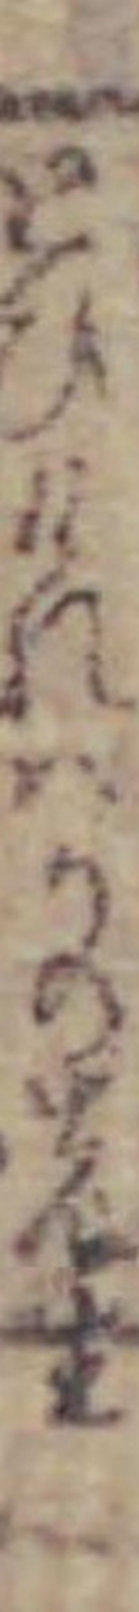とひければかの先生
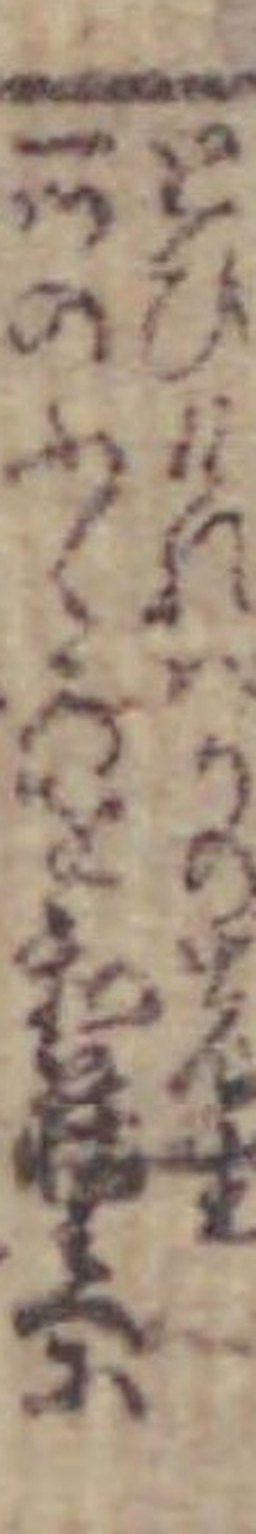一つのふくろを和荘兵へに
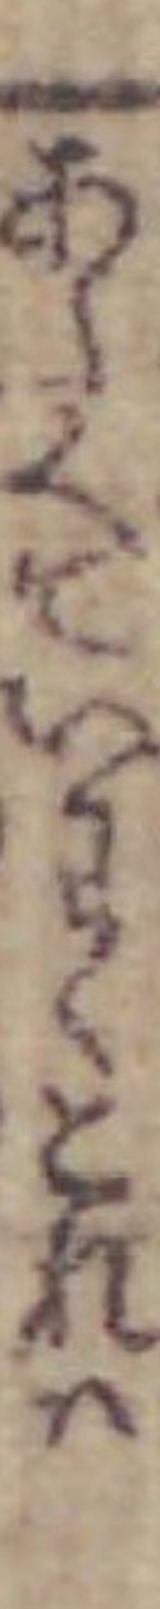あたへていわくこれは
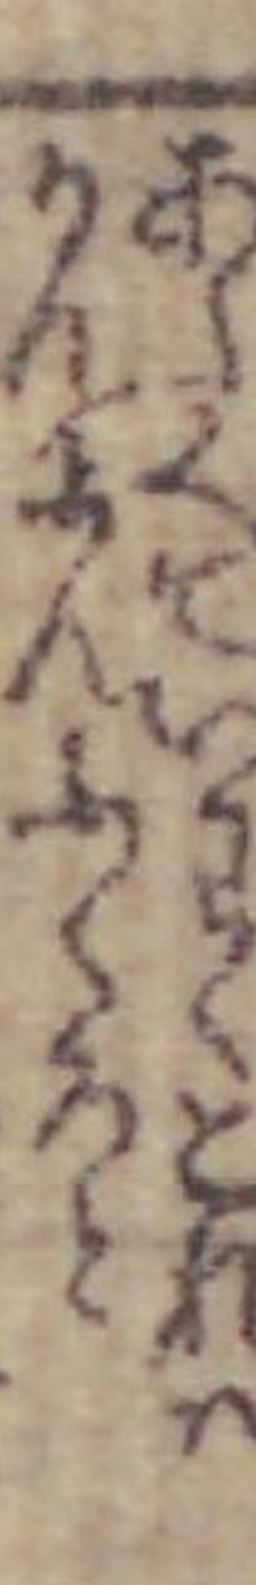かんにんふくろと
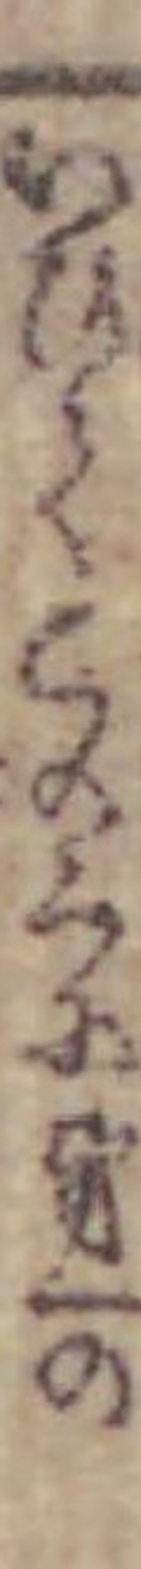いひてこのくに第一の
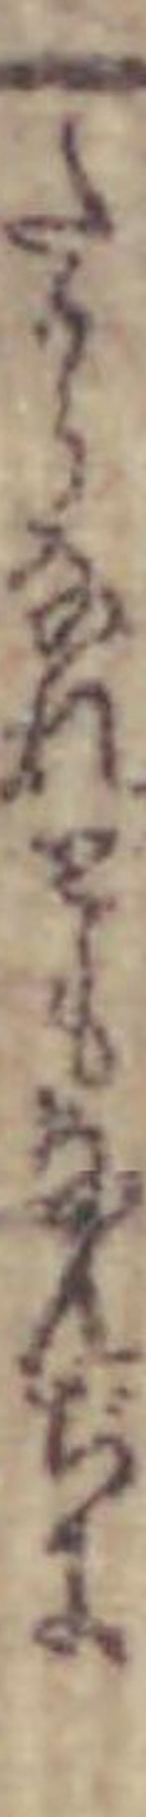たからなれどもなんぢに
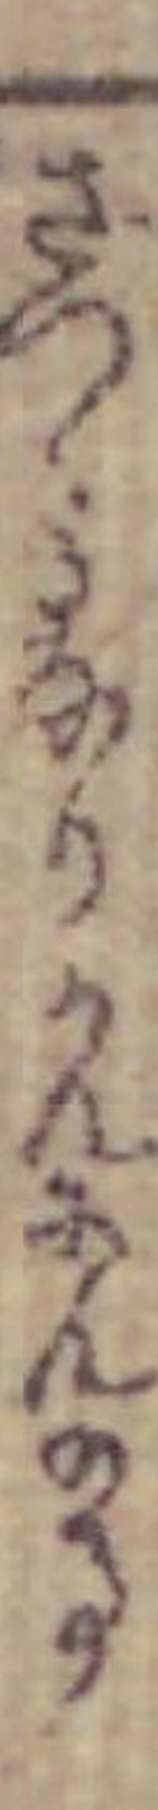さつくるなりかんにんの事
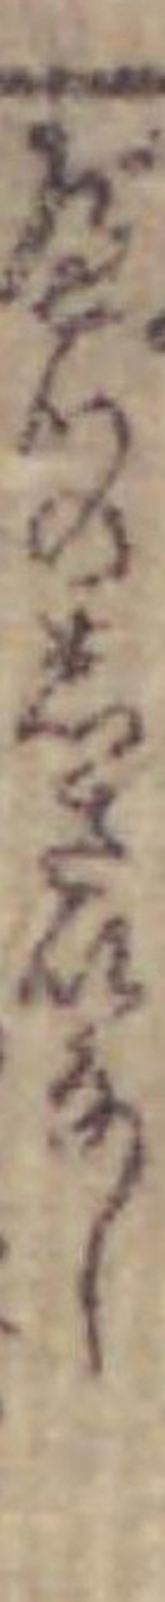べつのしさいなし
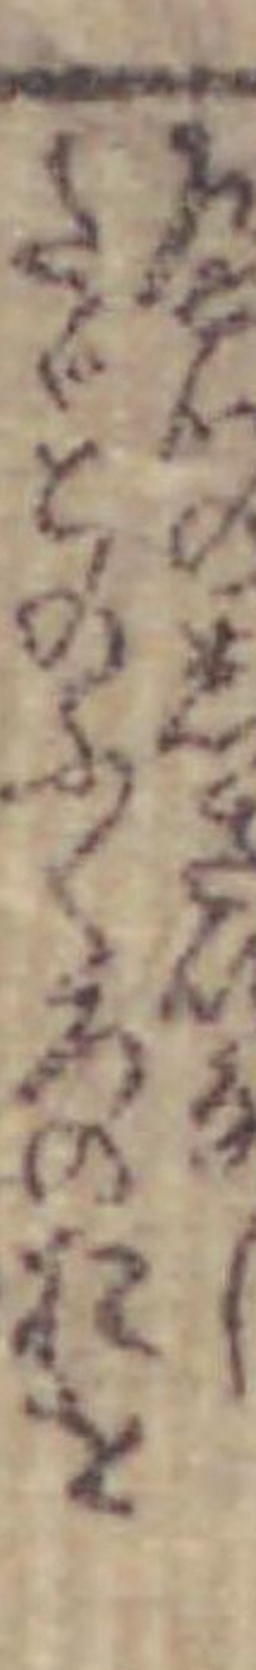たゞこのふくろのおを
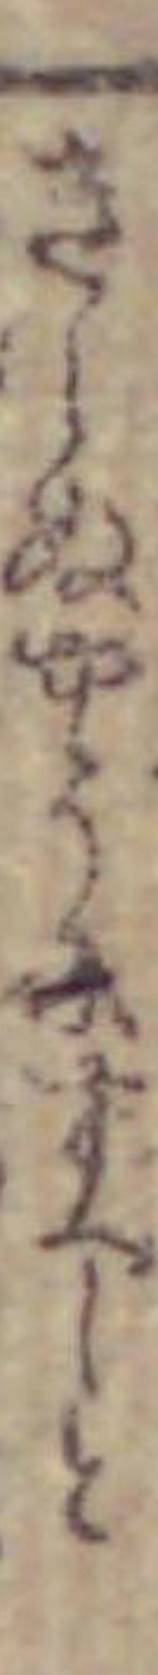きらぬやうにすべしと
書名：和荘兵衛後日話 : 3巻
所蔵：国立国会図書館 National Diet Library, JAPAN
